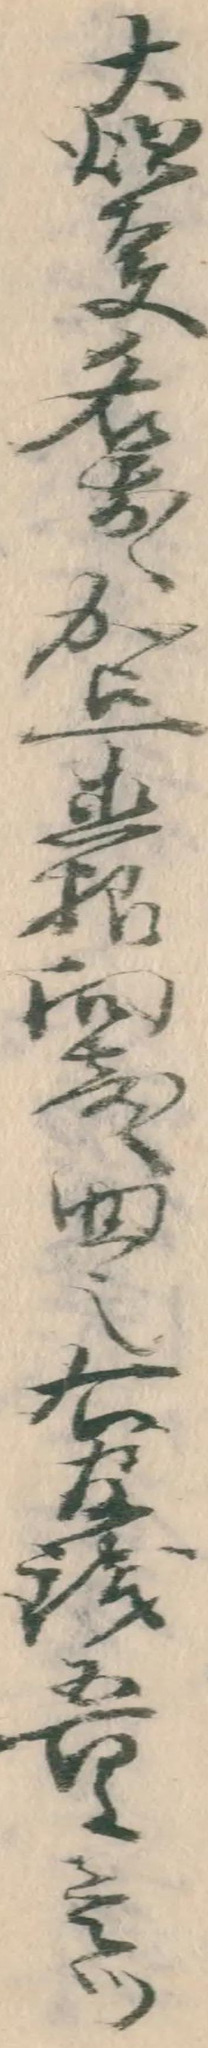大炊大夫名前へ加点直様向寄ヘ回之右官銭五百文壱ツ
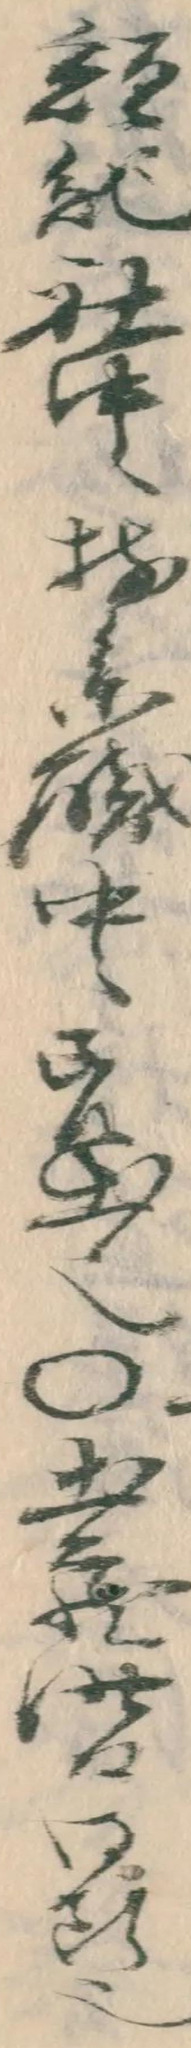経紀社中へ持参職中へ差出也○土蔵昨日同断也
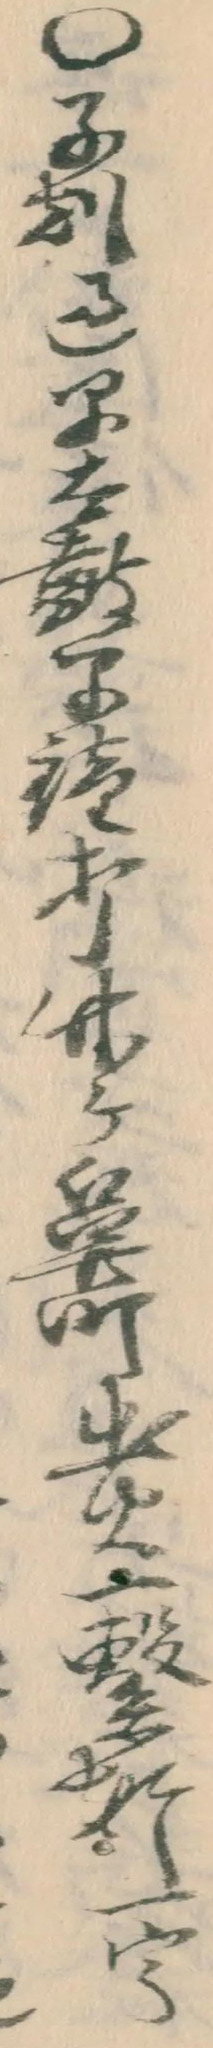◯子刻過早太鼓早鐘打竹ヶ鼻町出火一劇打一家
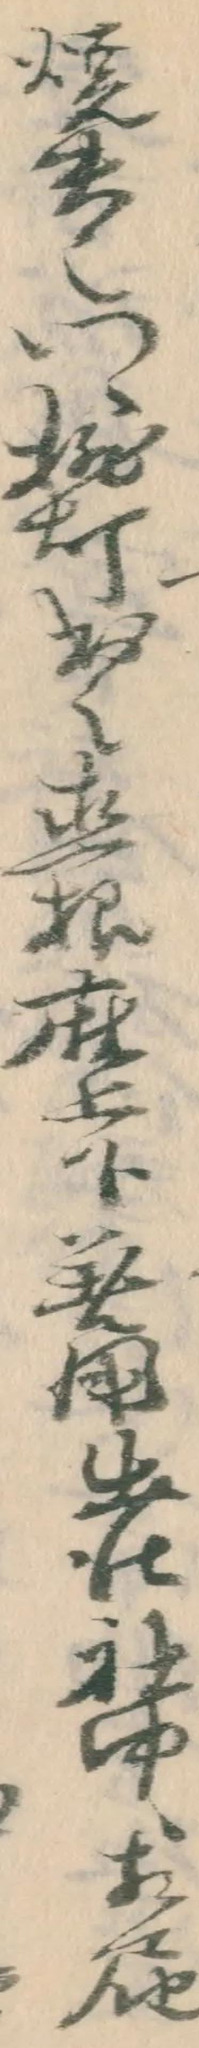焼失之門候挑灯出之直様麻上下着用出仕社中へ相届
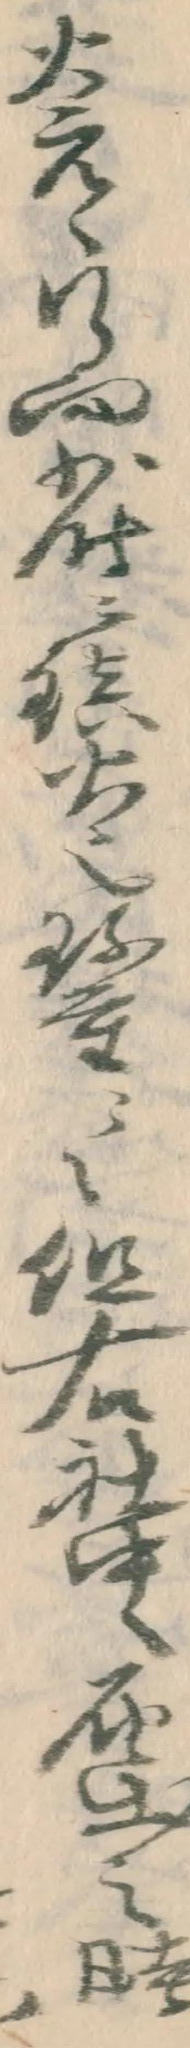火元へ行向少時ニ鎮火也珍重云々但右社中へ届出之時
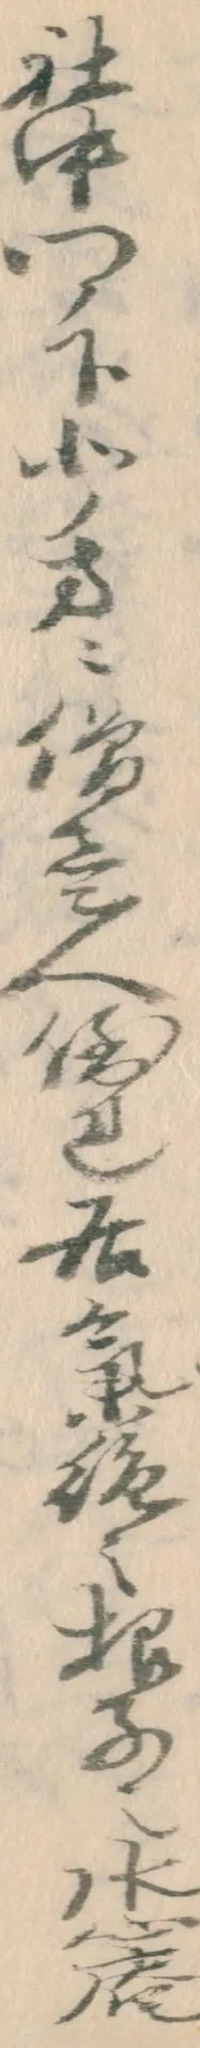社中門ノ下北ノ方ニ僧壱人倒れ居気絶之様子也水心庵
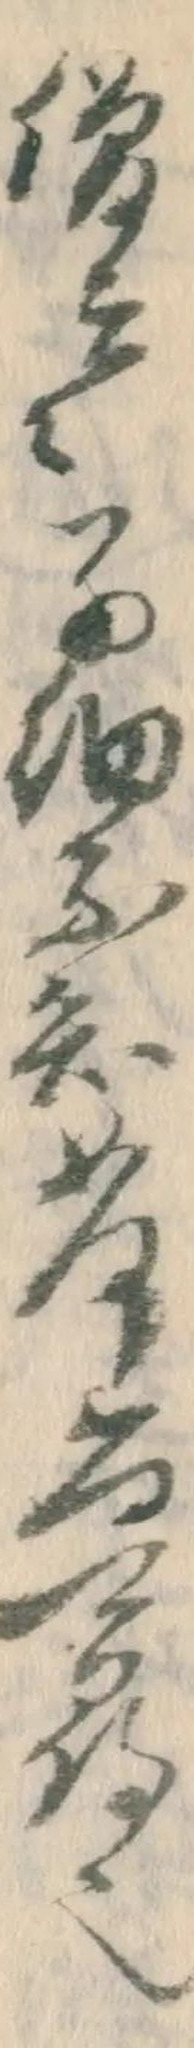僧云々別細不知如何尚可尋也
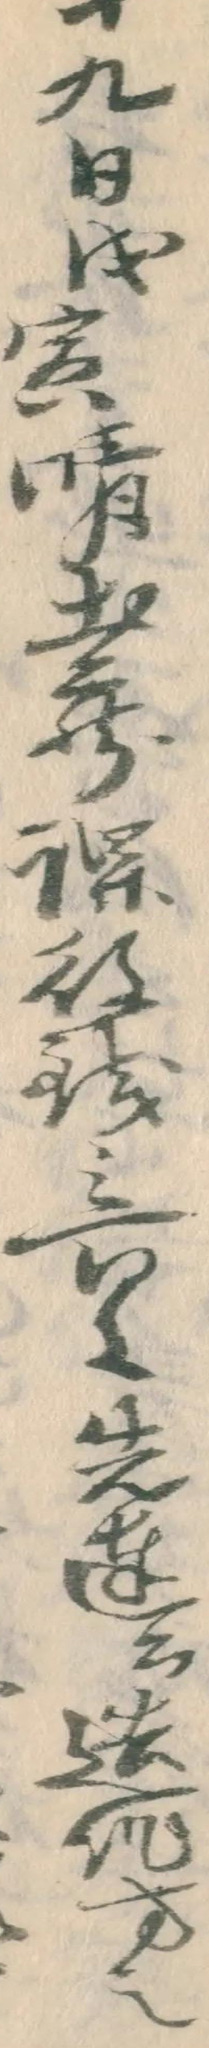十九日戊寅晴土蔵課役銭三百文先達而造作方之
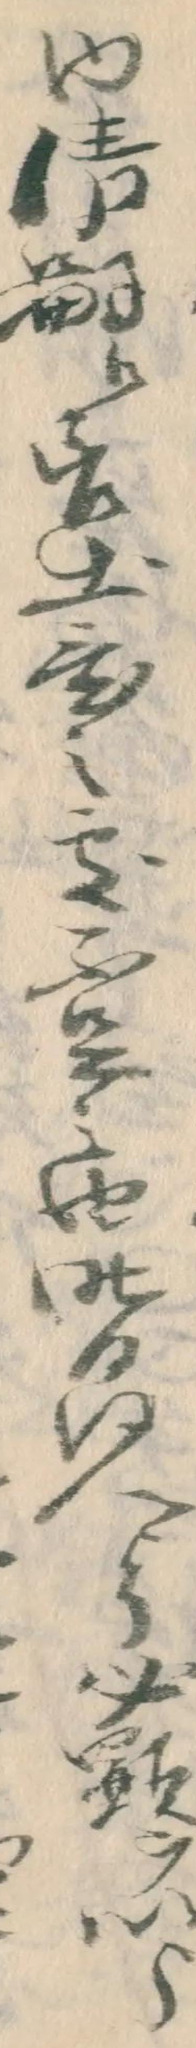内清嗣え差出置之處不足之由昨日同人より必顕ヲ以申
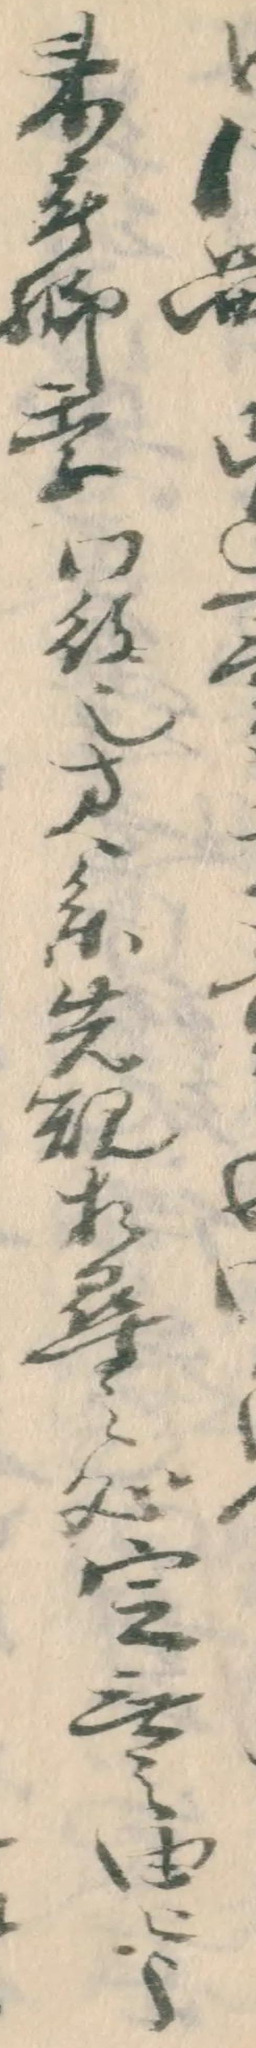来ニ付郷季同役之方へ参先規相尋候処定無之由被申
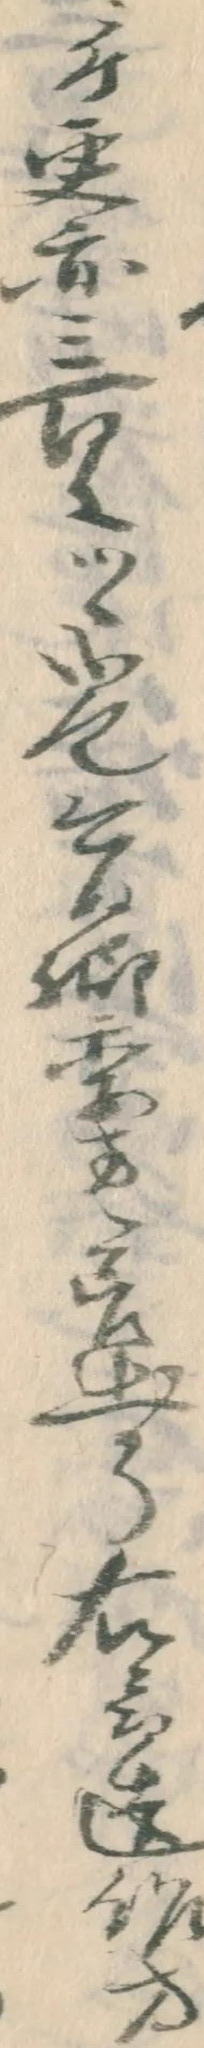ニ付更亦三百匁ツヽ弐包今日郷季方へ差出了右ニ而造作方
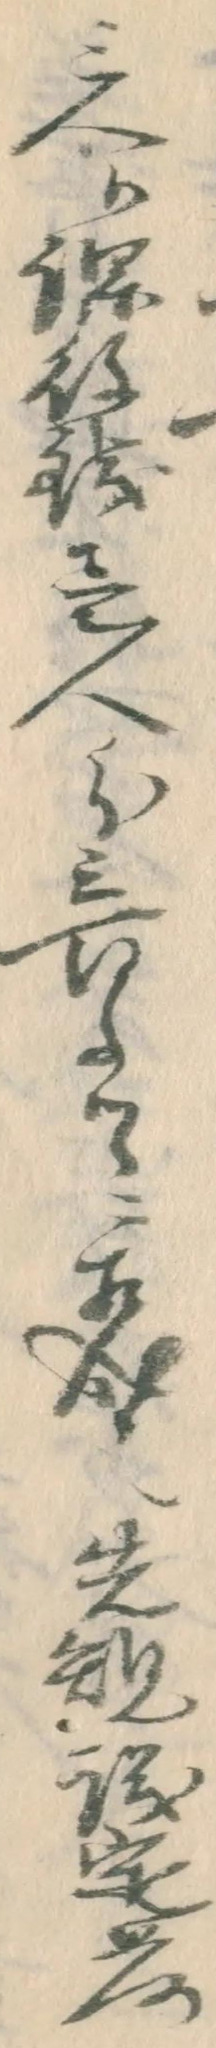三人え課役銭壱人分三百文ツヽ二相成候先規議定如何
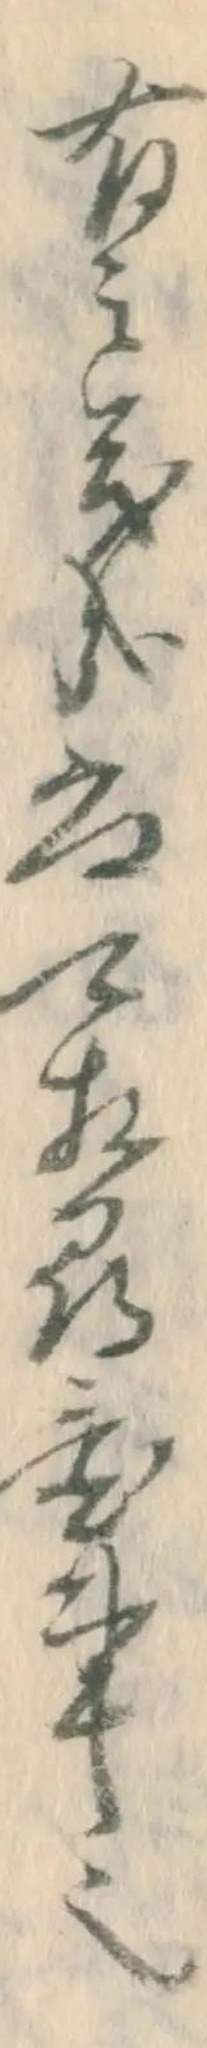有之義哉尚可相尋置事也
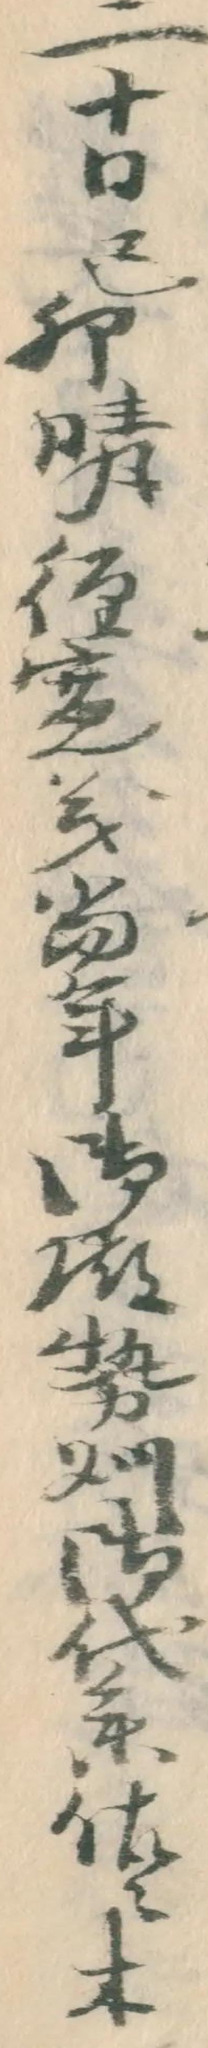二十日己卯晴経寛義當年御殿勢州御代参佐々木

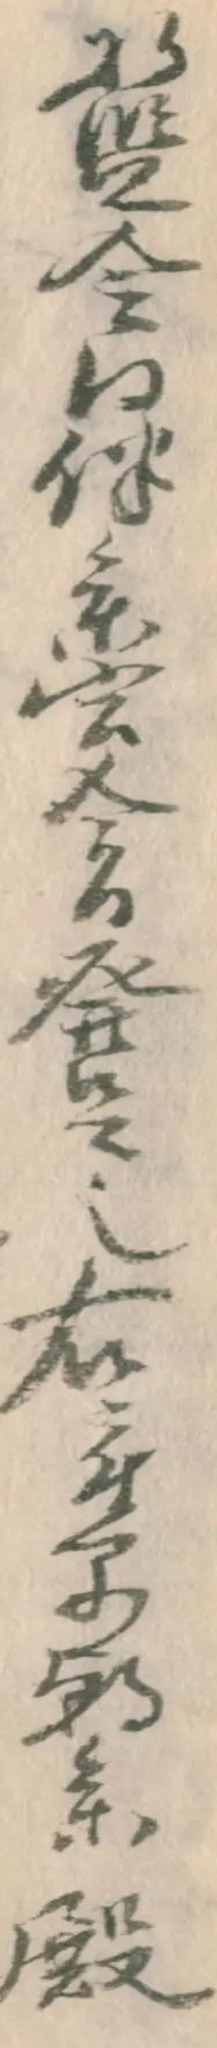将監令同伴参宮入旨発足也右ニ付早朝参殿
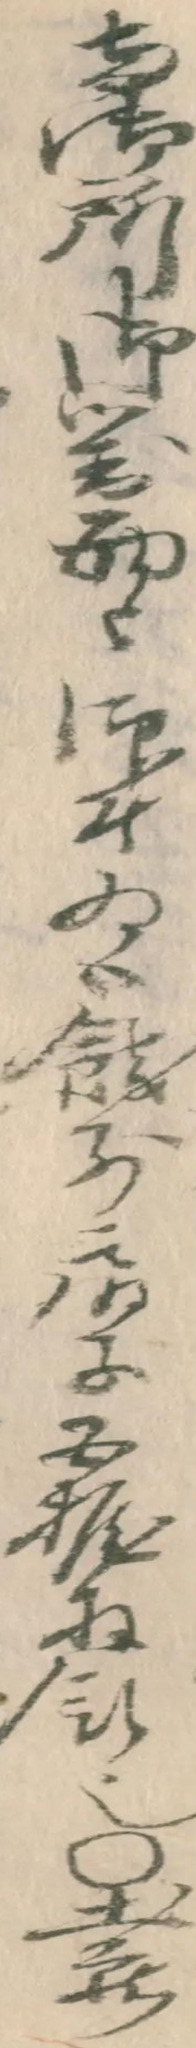両御所御對初被仰付為御餞別扇子五振拝領也○土蔵
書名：賀茂社記録. 第67冊
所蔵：国立国会図書館 National Diet Library, JAPAN
